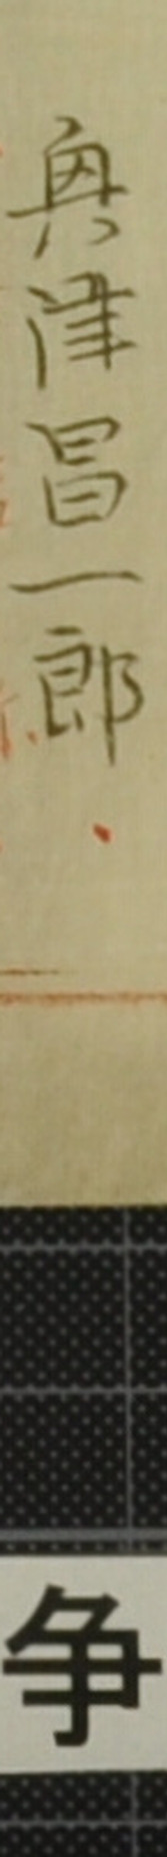奥津昌一郎・
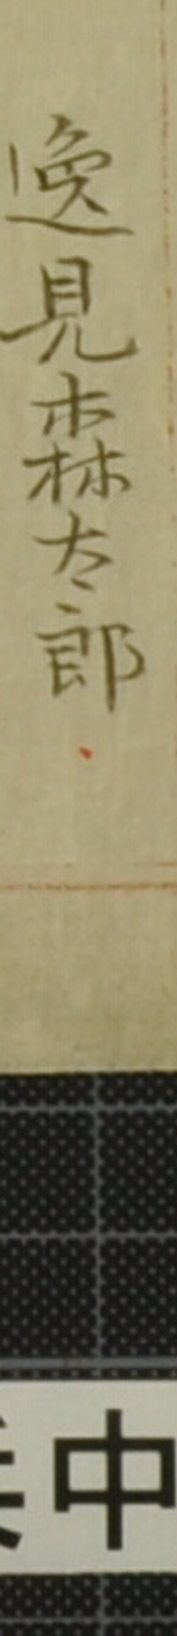逸見森太郎・
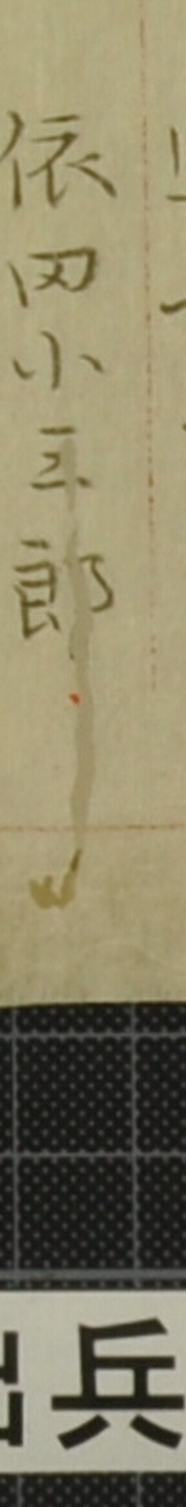依田小三郎・
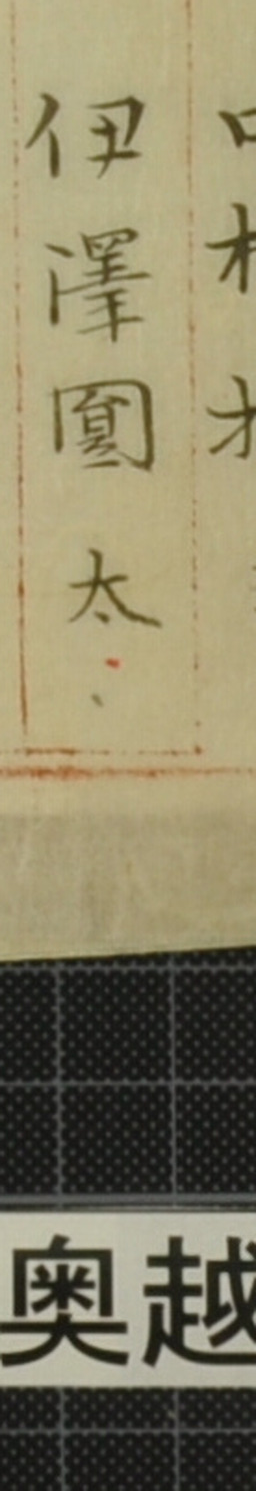伊澤円太・
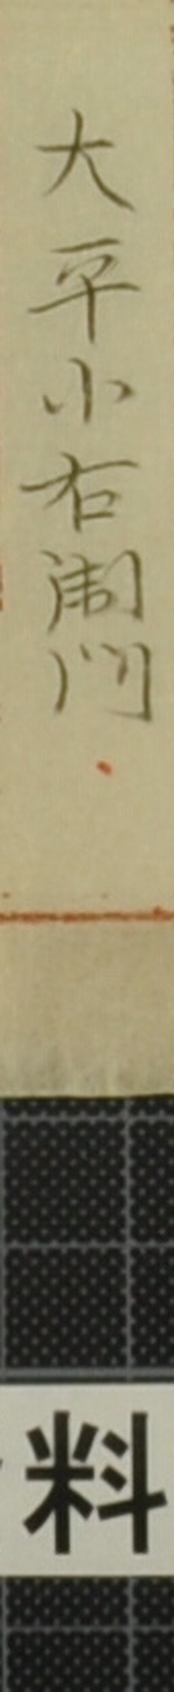大平小右衛門・
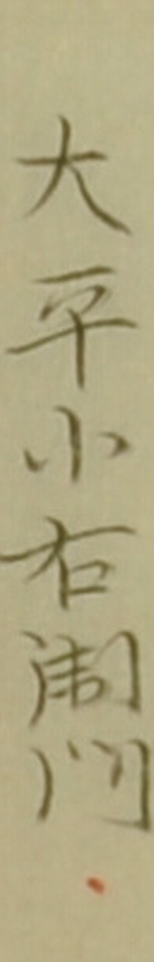大平小右衛門・
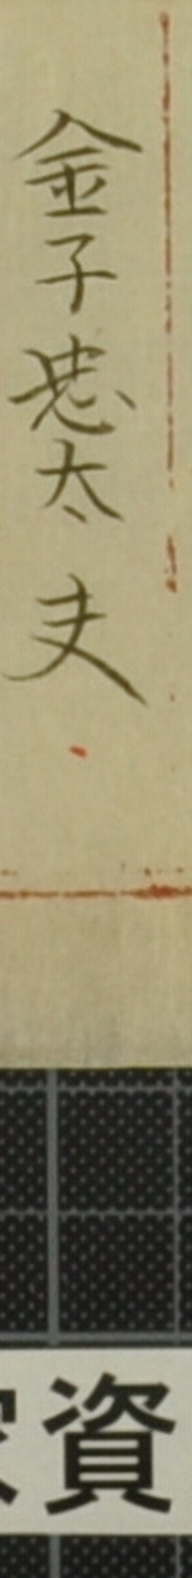金子忠太夫・
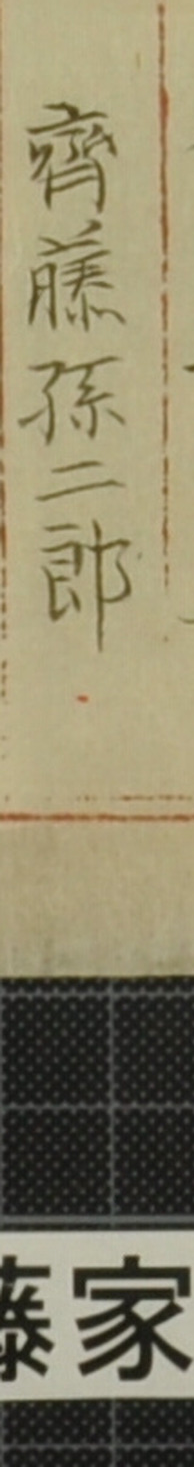斉藤孫次郎・
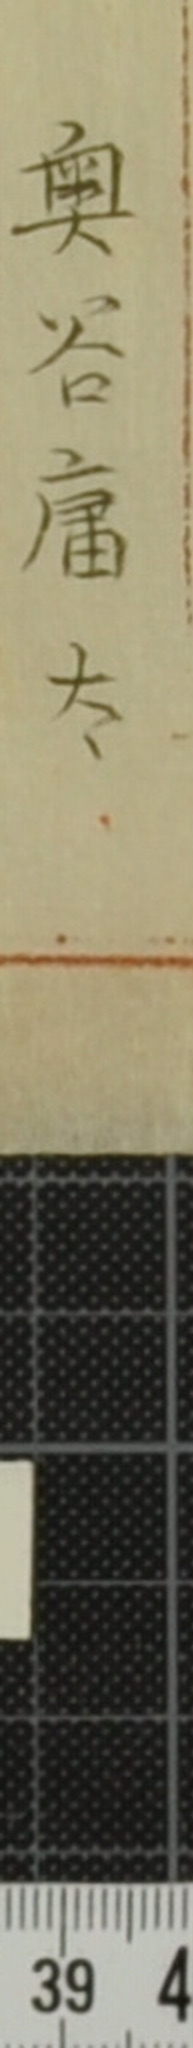奥谷庸太・
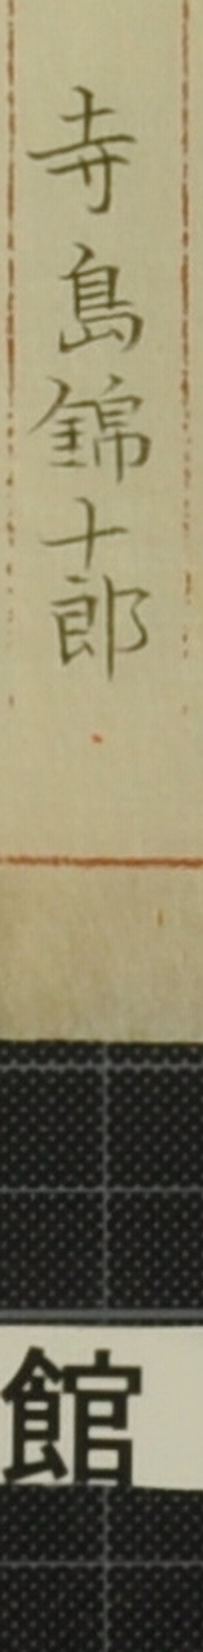寺嶋錦十郎・
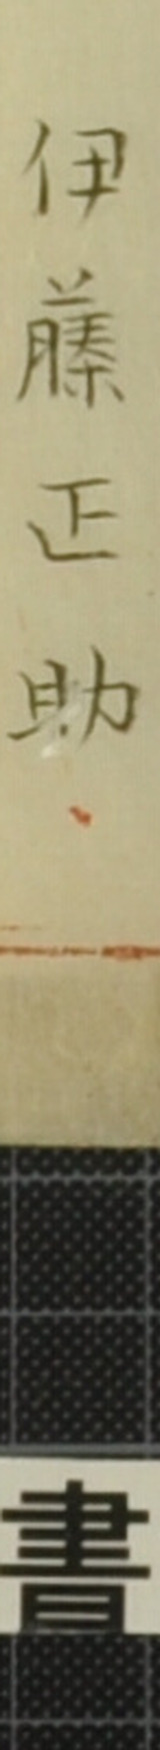伊藤正助・

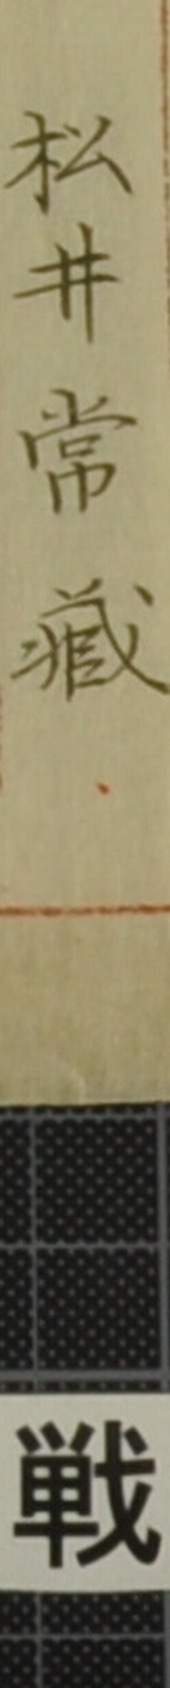松井常蔵・
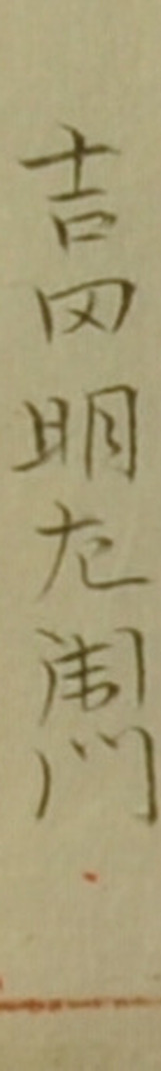吉田明左衛門・
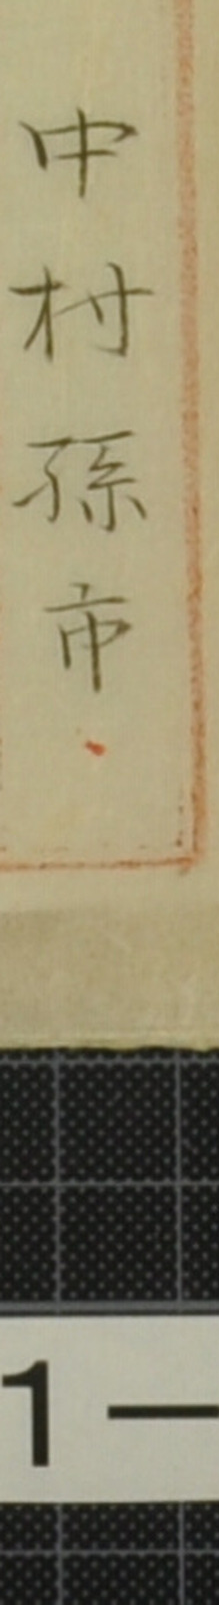中村孫市・
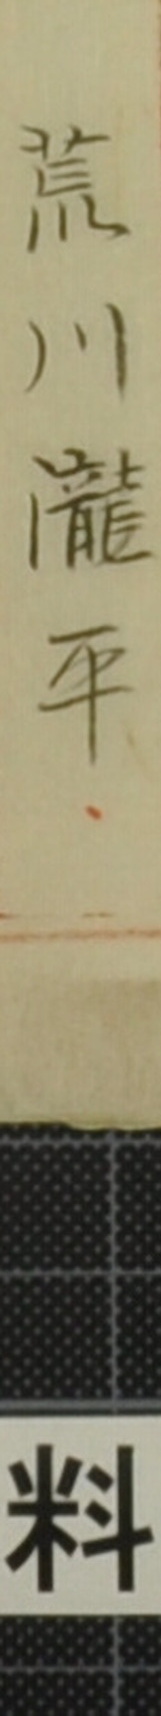荒川瀧平・
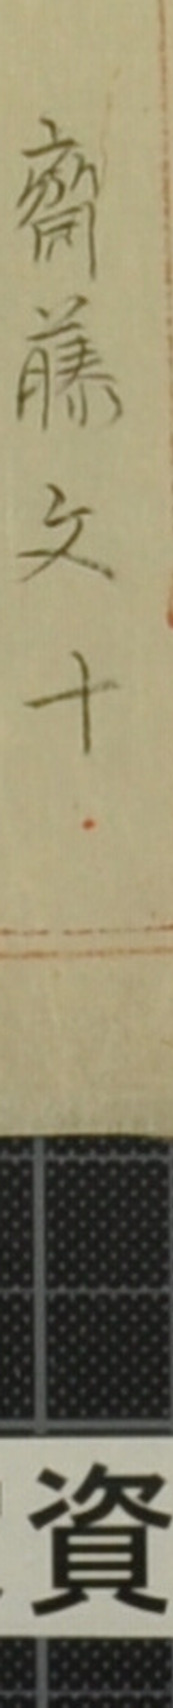齋藤文十・
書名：奥越出兵中戦争之事件概略抄録（控）
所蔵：伊那市立高遠町図書館・合同会社AMANE
